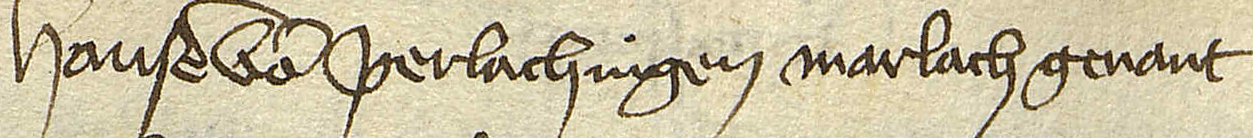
hanſe* vo* Perlachingen marlach genant
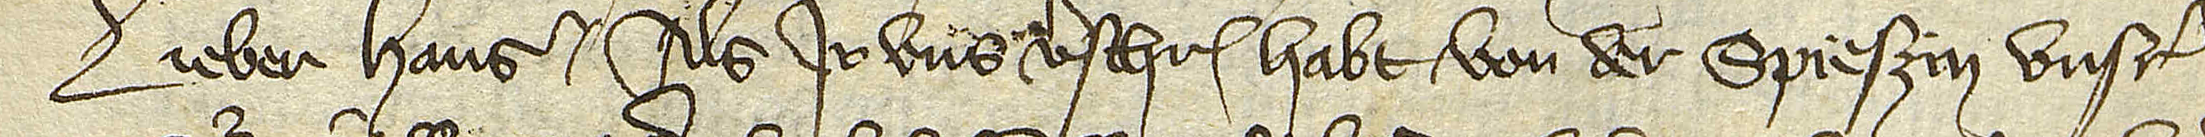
Lieber hans / Als Ir vns v*ſchr* habt / von der Spieſʒin vnſr*
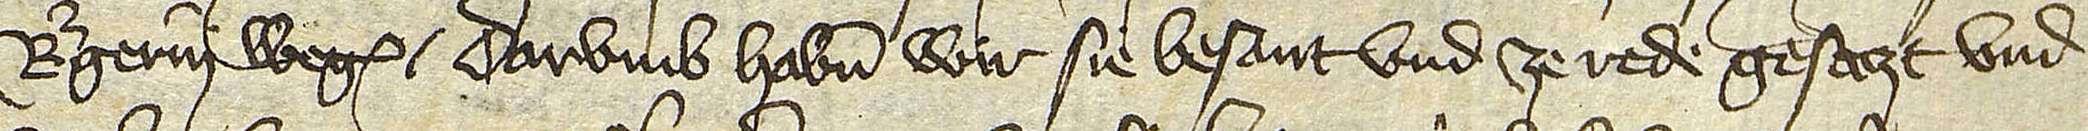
B*gerin* weg* / Darvmb habn* wir ſie beſant vnd cʒe rede geſacʒt vnd
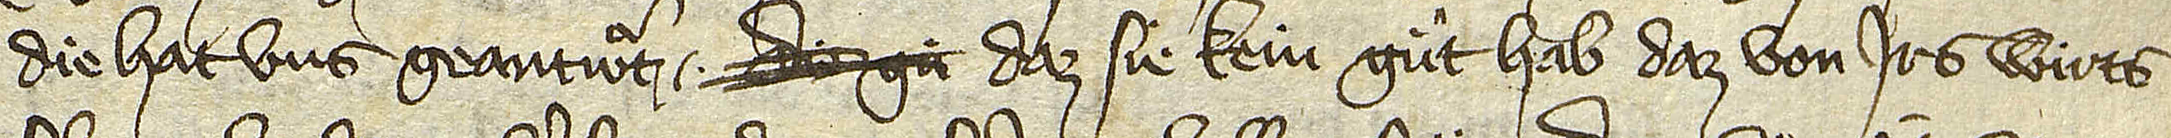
die hat vns geantwt* / Die gü daʒ ſie kein güt hab daʒ von Irs wirts
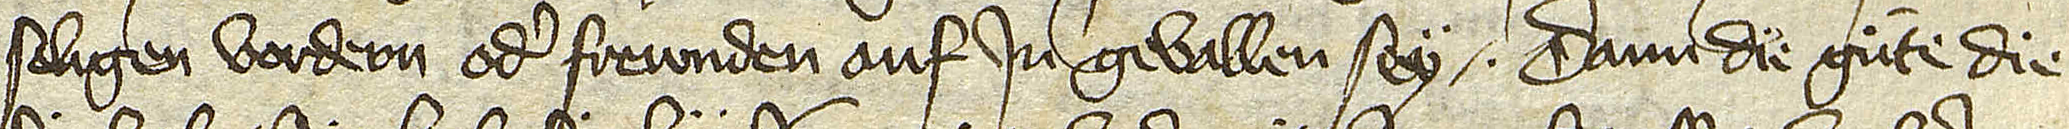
ſeligen vordern od* frewnden auf In gevallen ſey / . Dann die güte die
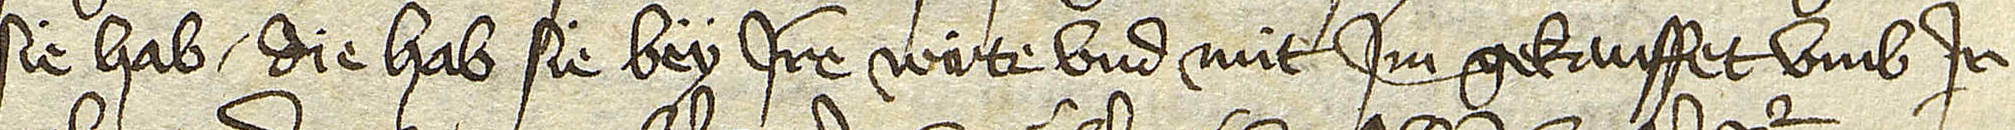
ſie hab / die hab ſie bey Ire* wirte vnd mit Im gekauffet vmb Ir
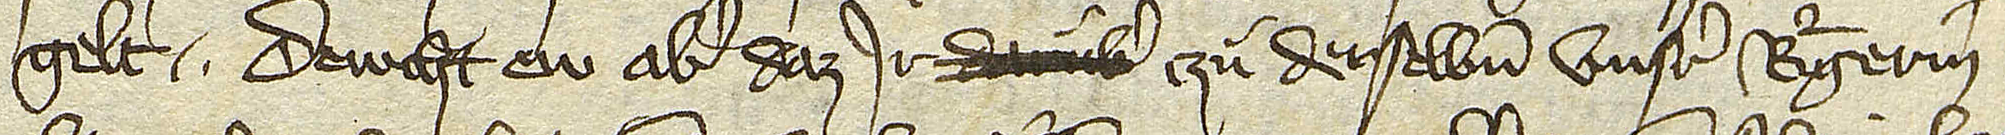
gelt / . Dewcht ew ab* daʒ Ir darüb* cʒü derſelbn* vnſr* B*gerin
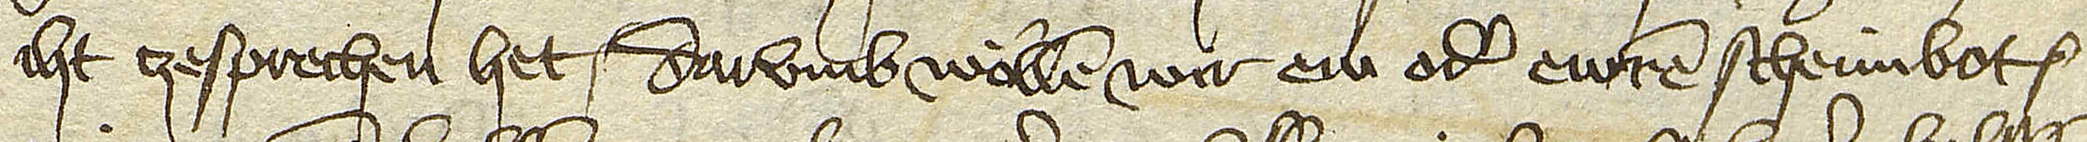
iht cʒeſprechen het / Darvmb wölle* wir ew od* ewre* ſcheimbot*
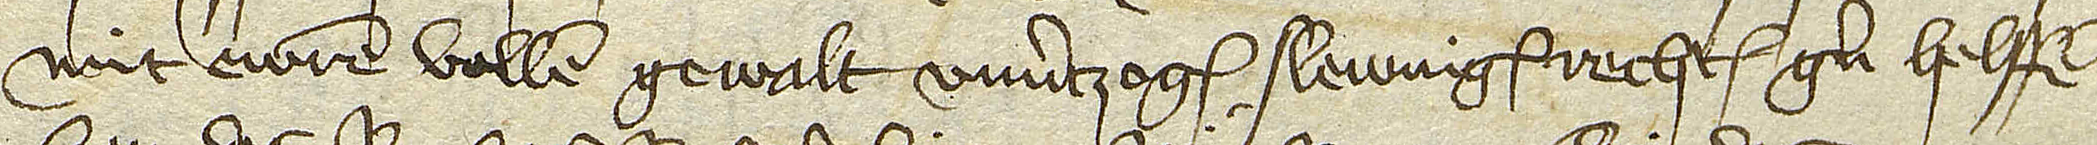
mit ewre* volle* gewalt vnu*cʒog* ſlewnig* recht* g*n helffe*
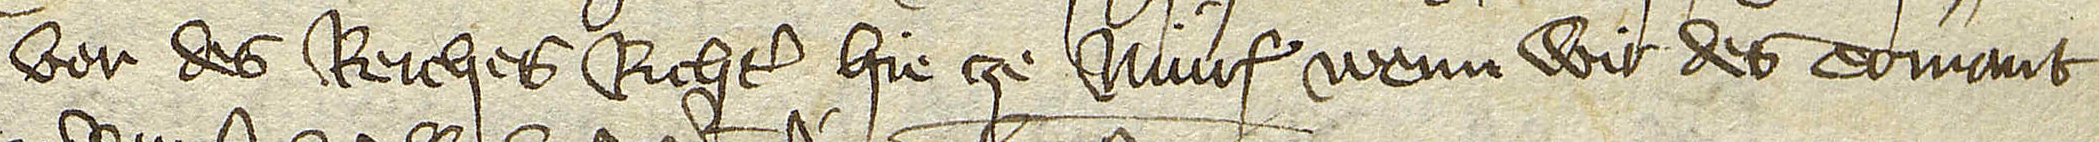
vor des Reiches Richt* hie cʒe Nür* wenn wir des ermant
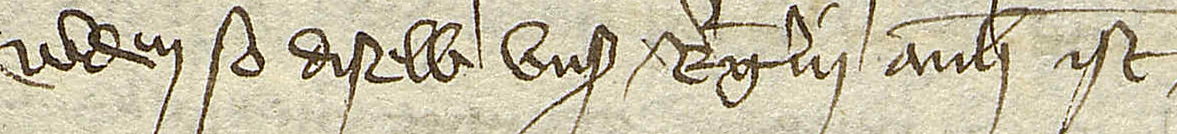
w*den ſo diſelb vnſ* B*g*in anh* iſt /
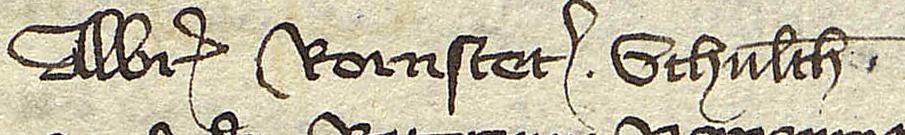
Albr* Kornſtet* . Schulth*
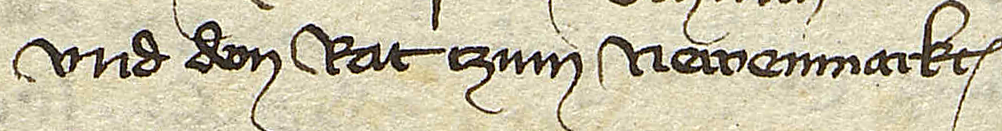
vnd dem Rat cʒum Newenmarkt
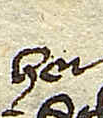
her
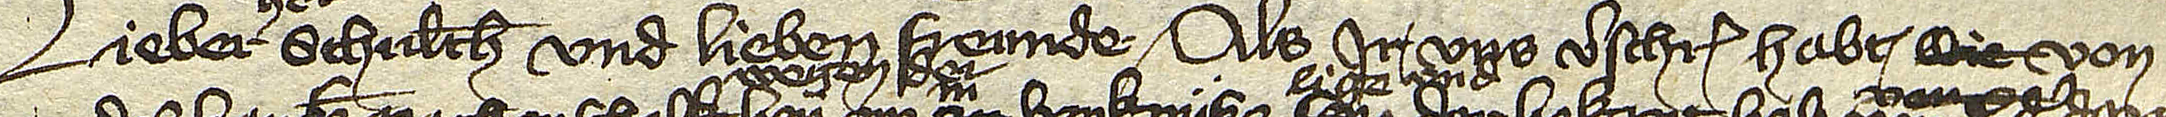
Lieber Schulth* vnd lieben freunde / Als Ir vns v*ſchr* habt / wie von
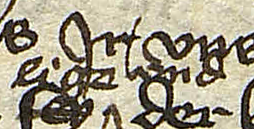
lige vnd
